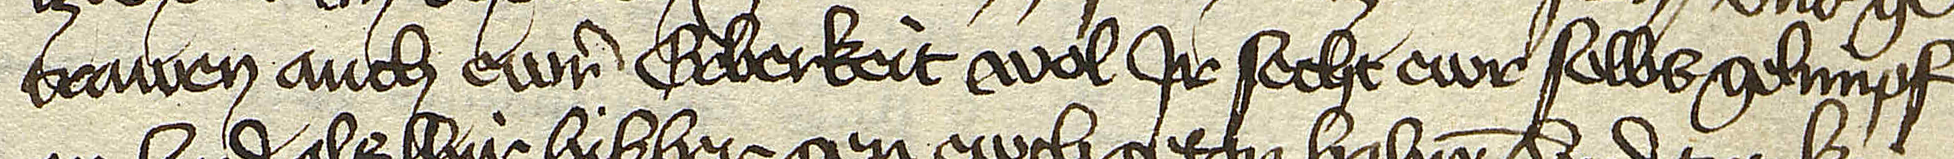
trawen auch ewr* Erberkeit wol Ir ſecht ewr ſelbs gelimpf
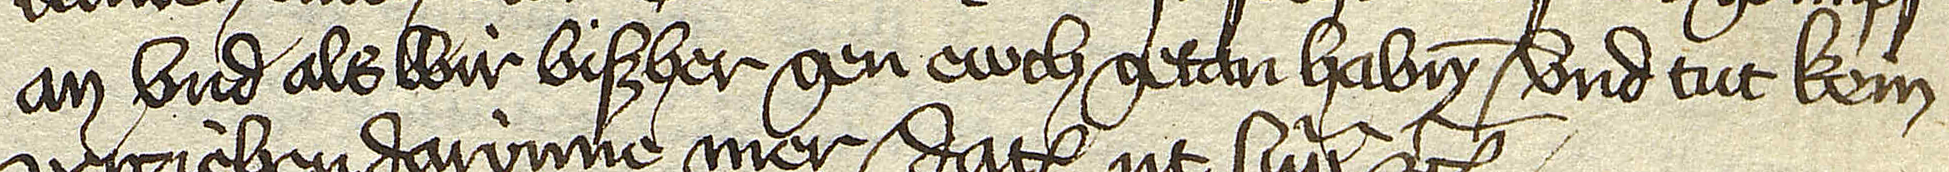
an vnd als wir biſʒher gen ewch getan habn* / vnd tut kein
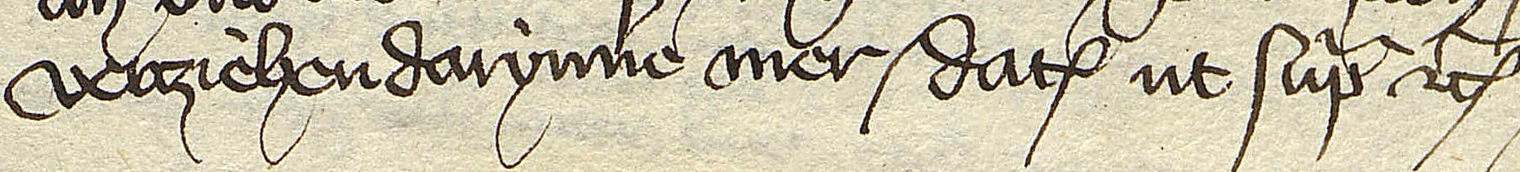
vercʒiehen darynne mer / dat* ut ſup* ec* /
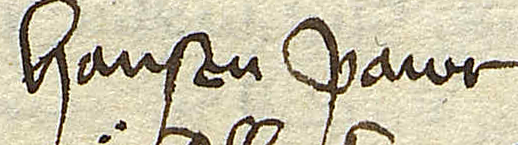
Hanſen Pawr
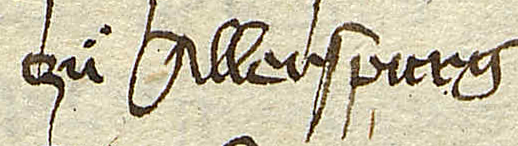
cʒü Allerſpurg
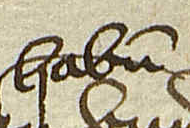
habn*
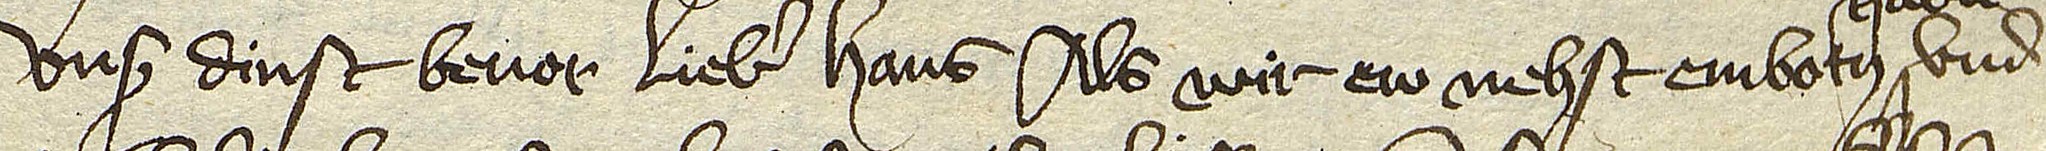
Vnſ* dinſt beuor Lieb* Hans Als wir ew nehſt embotn* vnd
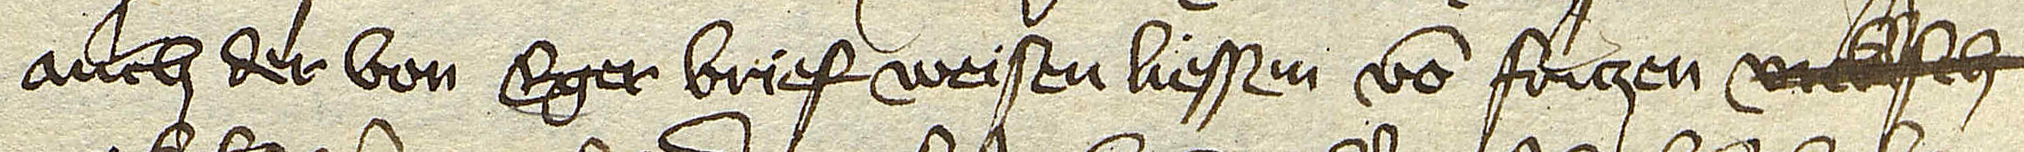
auch der von Eger brief weiſen lieſſen vo* Fricʒen vrcklſch
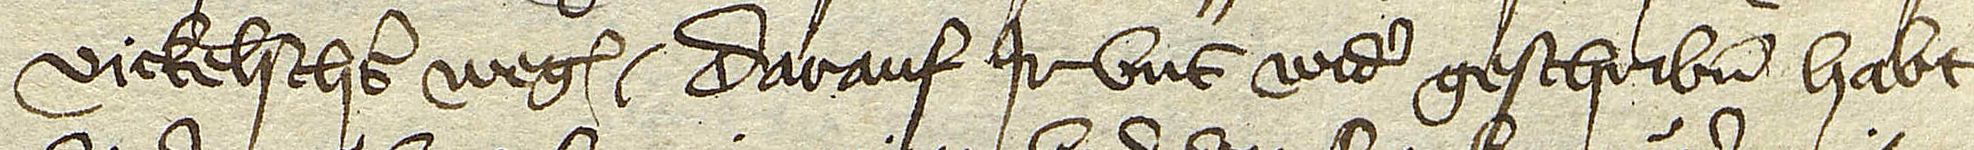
vickelſchs* weg* / Darauf Ir vns wid* geſchribn* habt
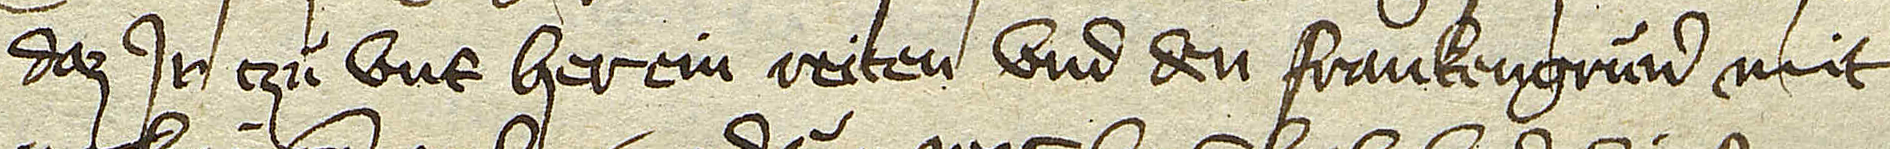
daʒ Ir cʒü vns herein reiten vnd den frankengrün* mit
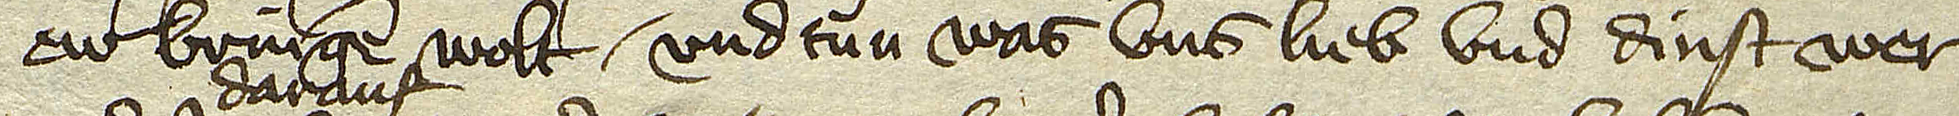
ew bringe* wolt / vnd tün was vns lieb vnd dinſt wer
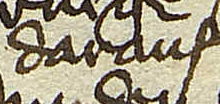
darauf
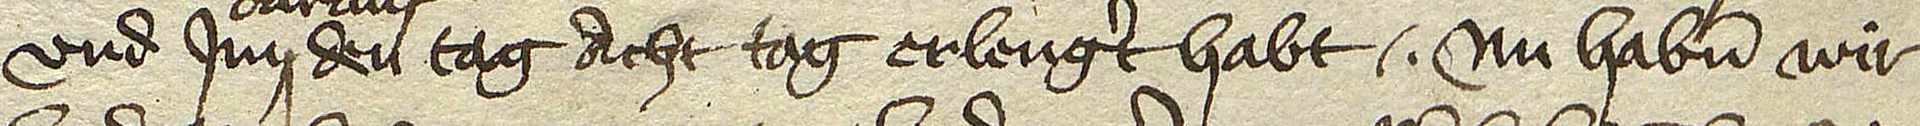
vnd Im den tag Acht tag erlengt* habt /. Nu habn* wir
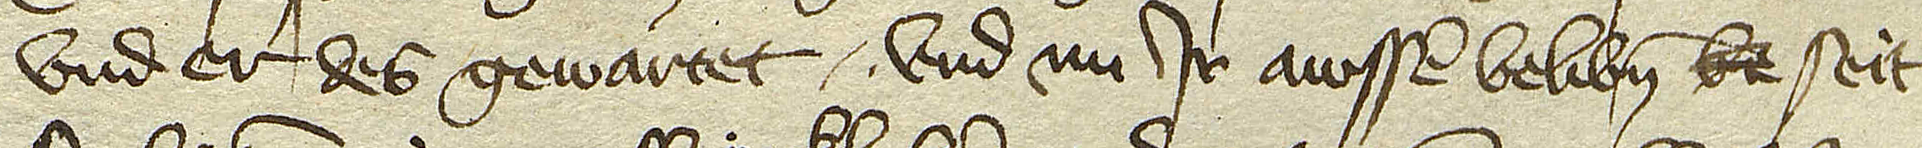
vnd er des gewartet / . vnd nu Ir awſſe* belibn* be ſeit
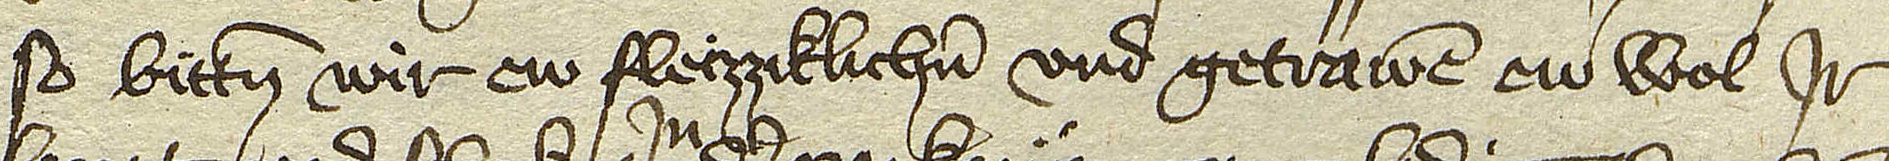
ſo bittn* wir ew fleiʒʒiklichn* vnd getrawe* ew wol Ir
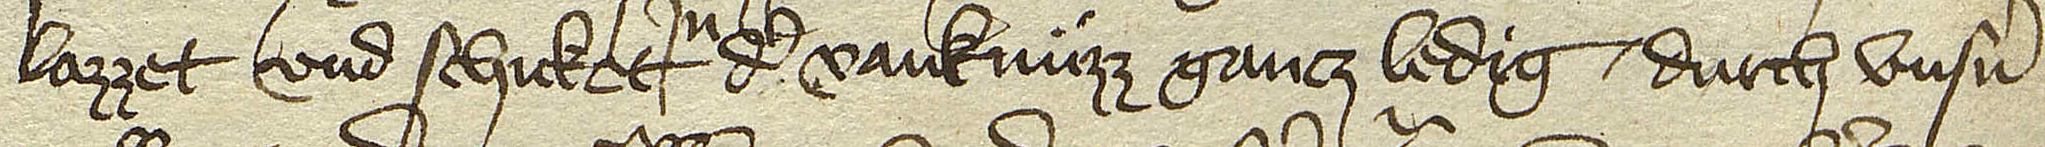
laʒʒet vnd ſchicket d* vanknüʒʒ gancʒ ledig / durch vnſn*
